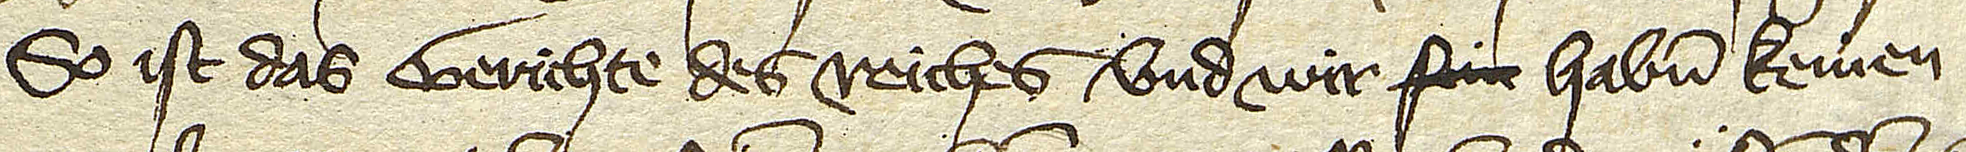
So iſt das Gerichte des reiches / vnd wir ſein habn* keinen
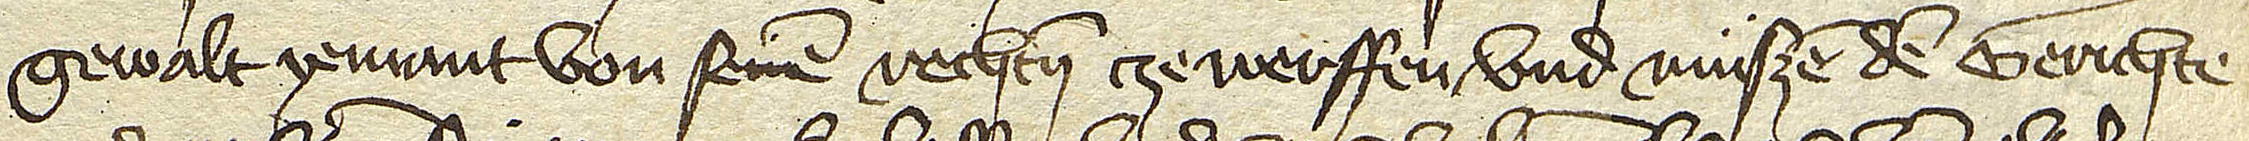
gewalt yemant von ſeine* rechtn* cʒe werffen / vnd müſʒe* de* Gerichte
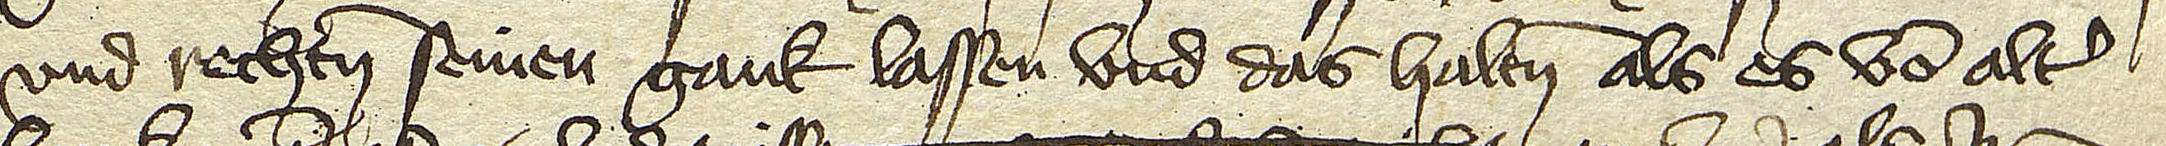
vnd rechtn* ſeinen gank laſſen vnd das haltn* als es vo* alt*
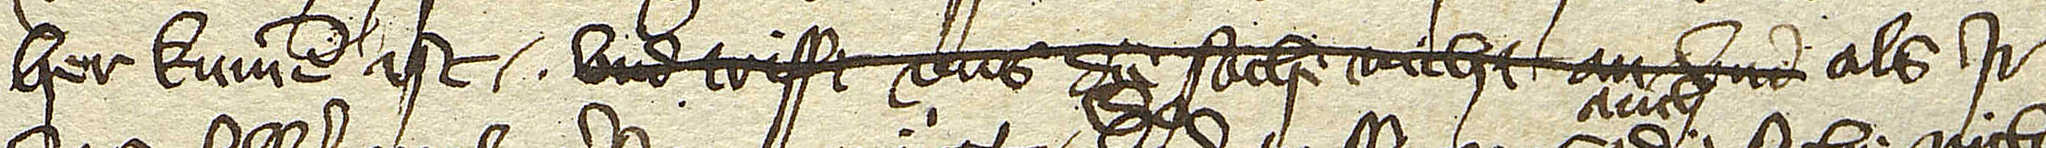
her kume* iſt / . vnd trifft vns die ſache nicht an / vnd als Ir
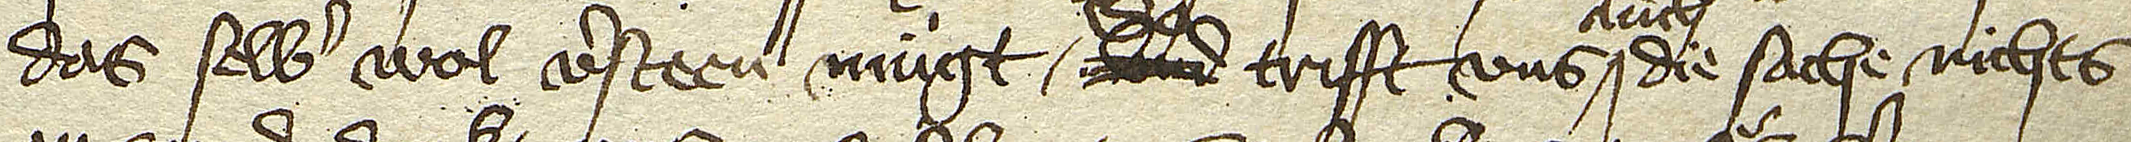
das ſelb* wol v*ſteen mügt / vnd trifft vns die ſache nichts
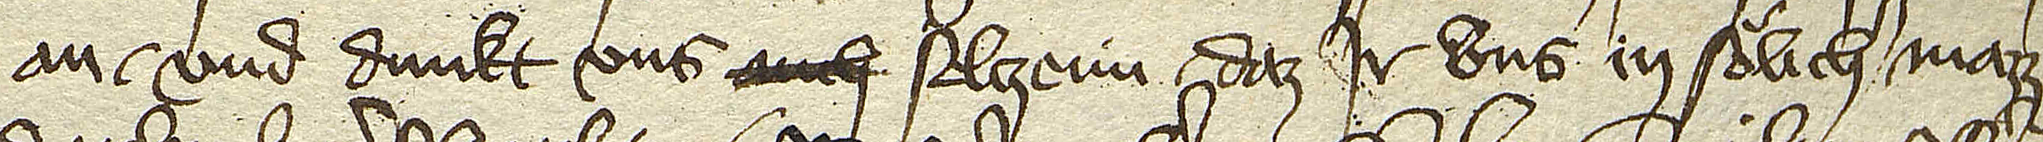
an / vnd dunkt vns auch ſelcʒeim / daʒ Ir vns in ſölich* maʒʒ
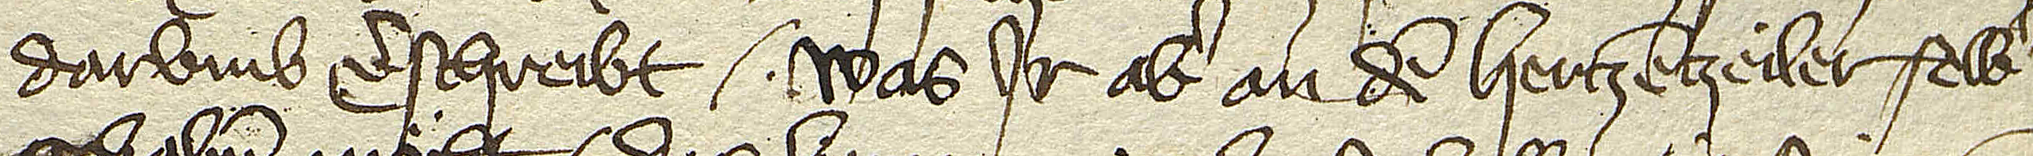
darvmb v*ſchreibt / . was Ir ab* d* hercʒe*cʒeiler ſelb*
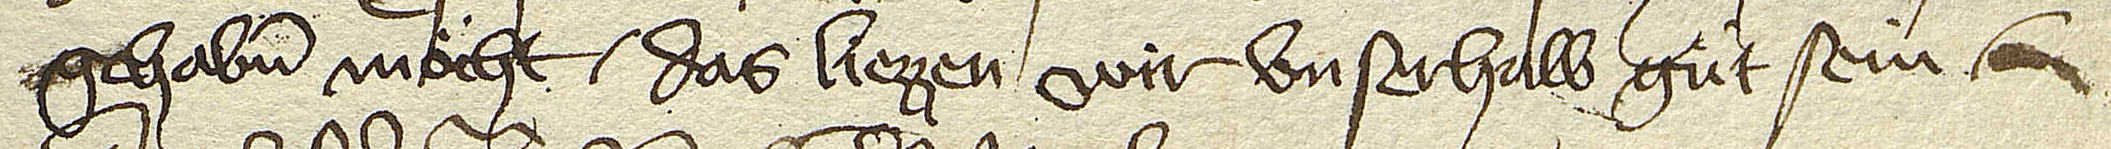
gehabn* möcht / das lieʒʒen wir vnſerhalb güt ſein /
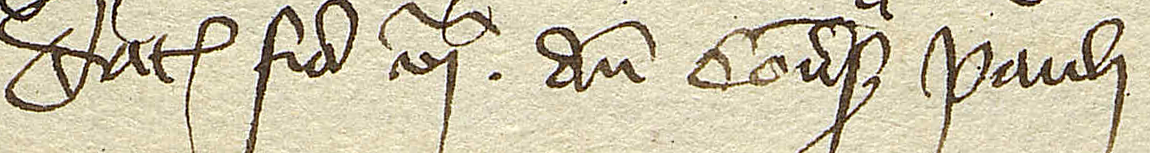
Dat* fia* vi* . an* Cou*ſ* Pauli
